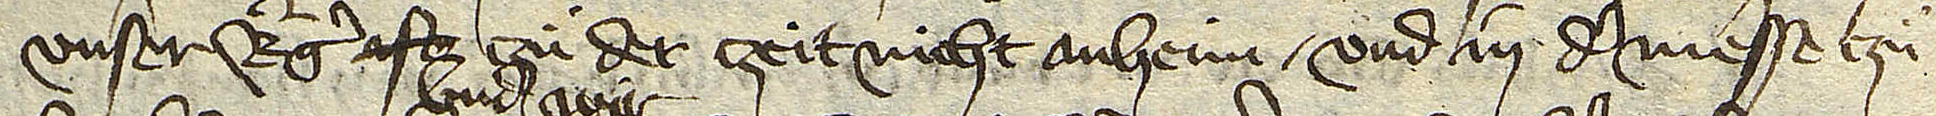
vnſer B*g* iſ eʒ cʒü der cʒeit nicht anheim / vnd in d* meſſe cʒü
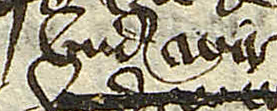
vnd wir
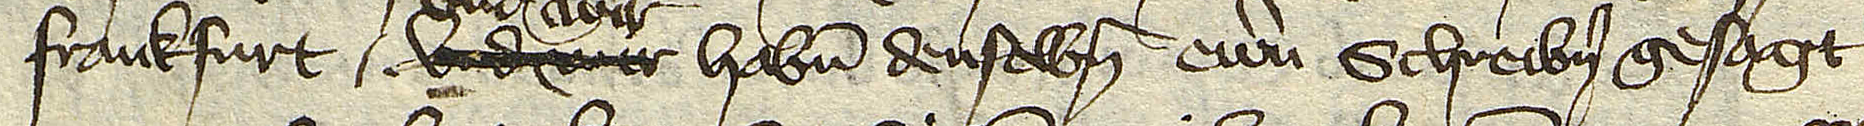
frankfurt / . vnd wir habn* denſelbn* ew*n Schreibn* geſagt
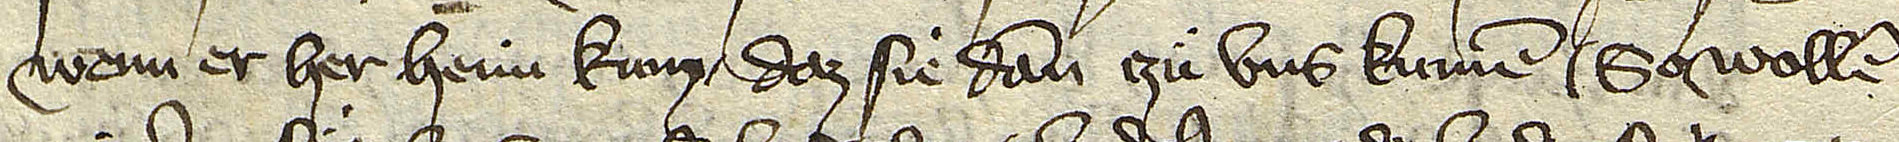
wenn er her heim kum / daʒ ſie dan* cʒü vns kume* / So wolle*
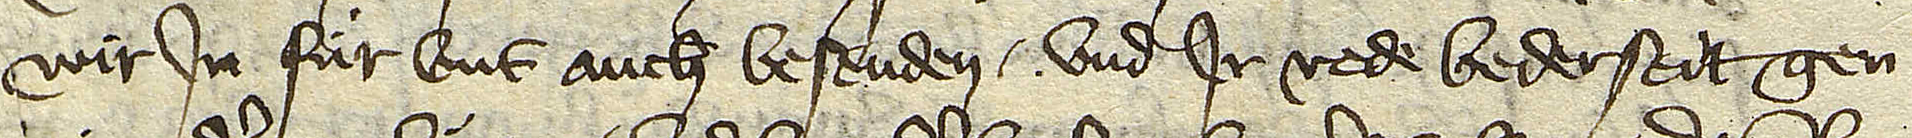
wir In für vns auch beſenden / . vnd Ir rede bederſeit gen
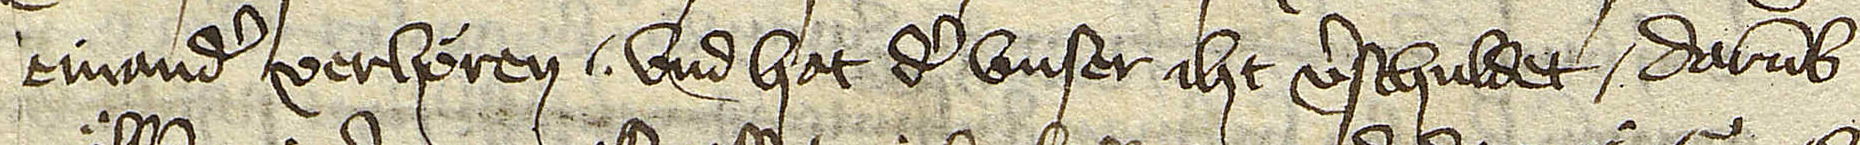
einand* verhören / . vnd hat d* vnſer iht v*ſchuldet / daru*b
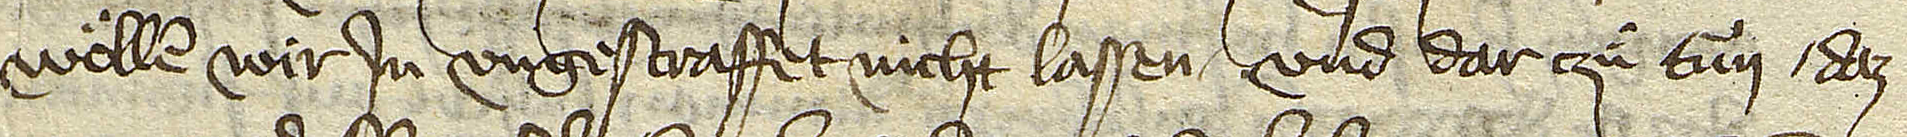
wölle* wir In vngeſtraffet nicht laſſen / vnd dar cʒü tün / daʒ
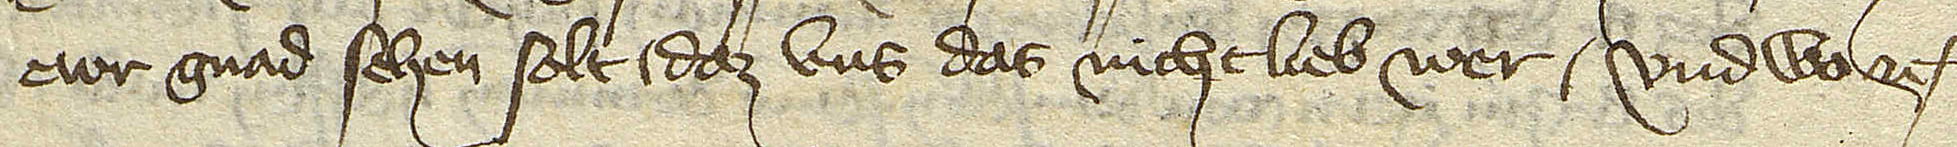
ewr gnad ſehen ſolt / daʒ vns das nicht lieb wer / vnd wo ec*
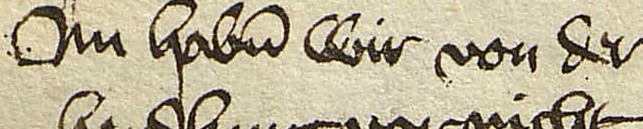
Nu habn* wir von der
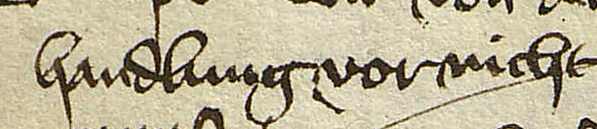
handlung vor nicht
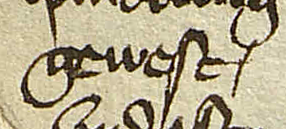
geweſt /
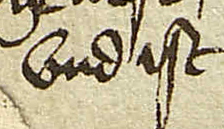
vnd iſt
